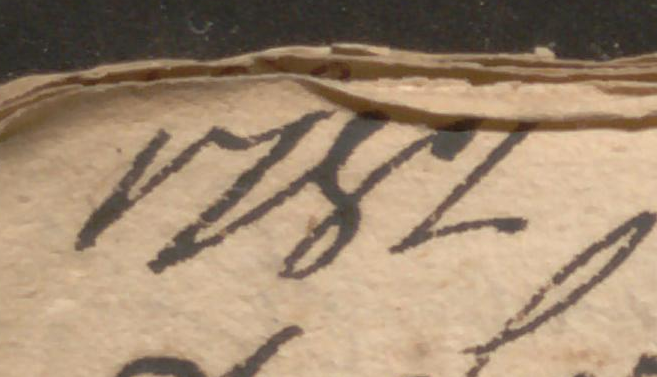1782
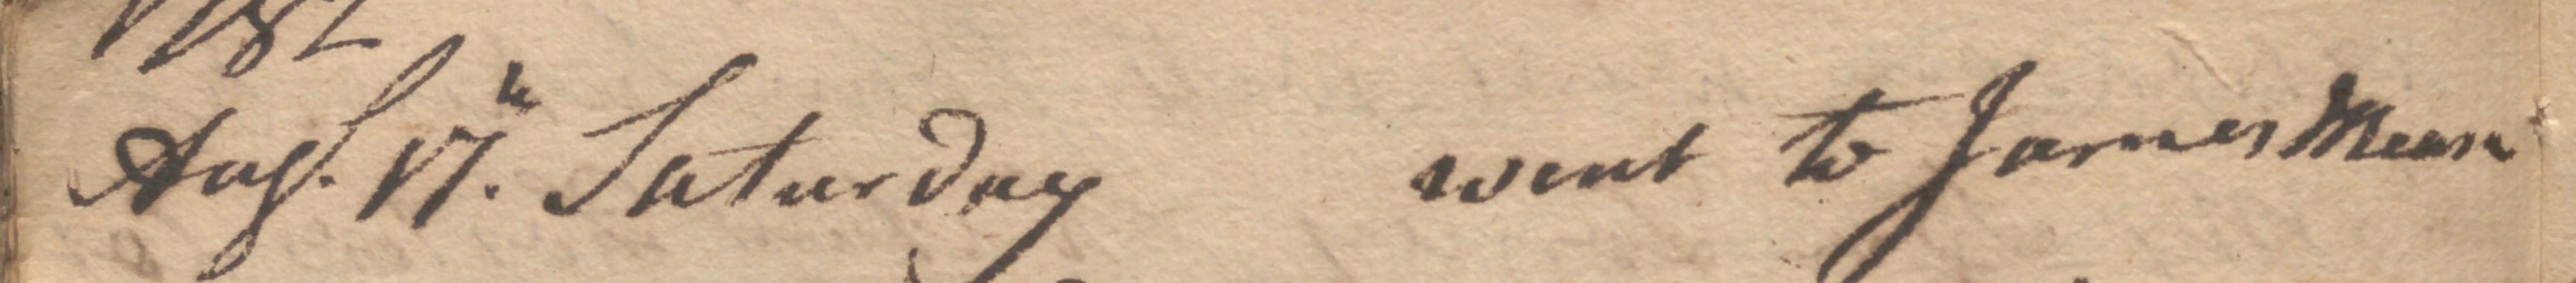Aug^t. 17^h. Saturday went to James Mease
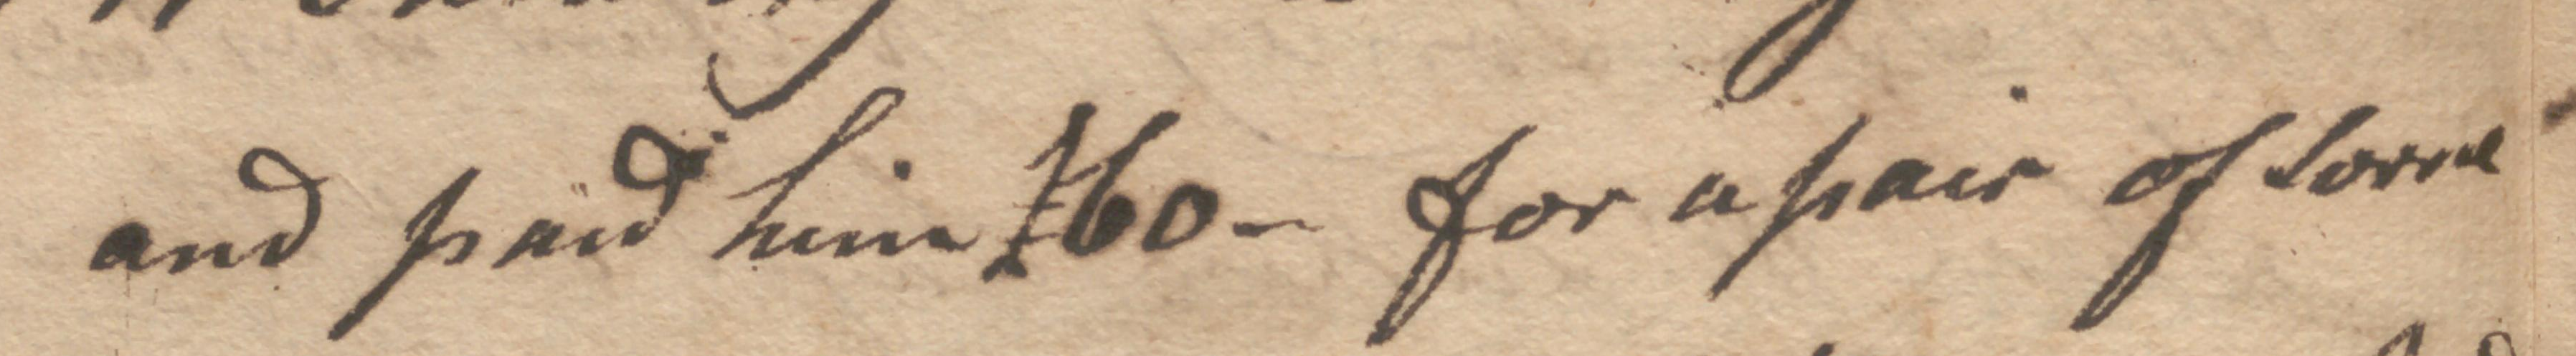and paid him f60- for a pair of sorrel
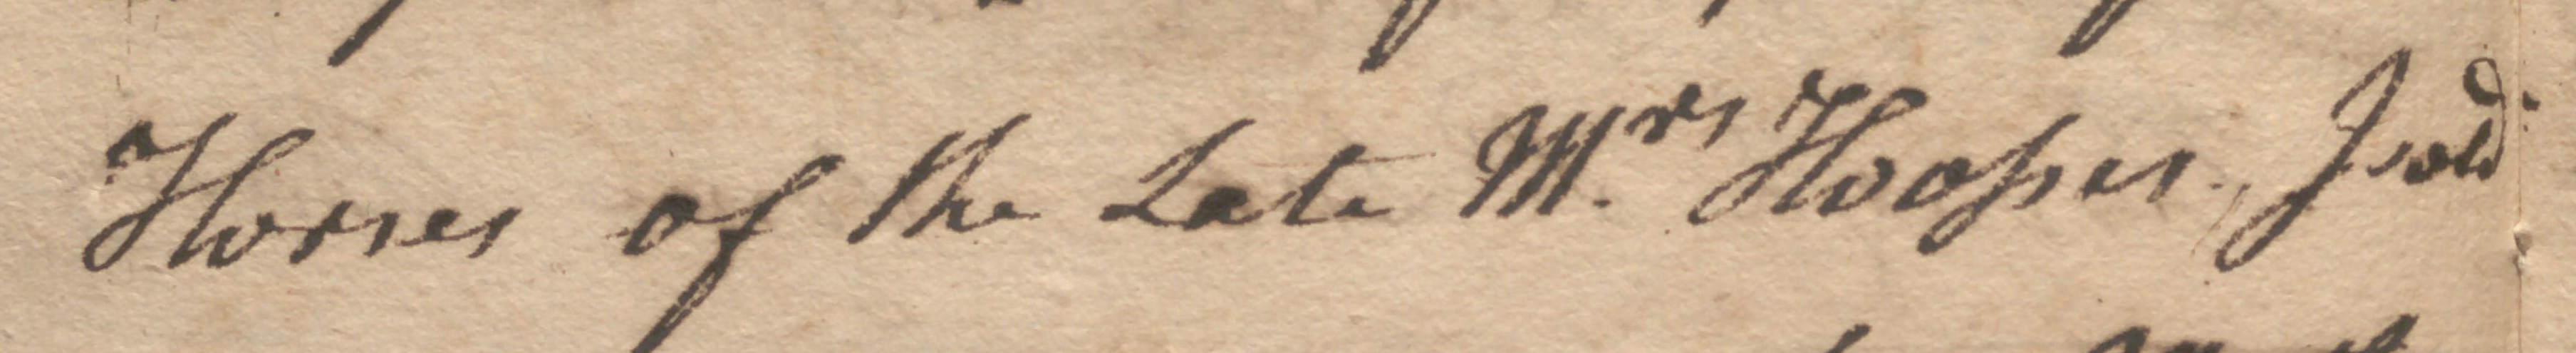Horses of the Late M^rs. Hoopes, I sold
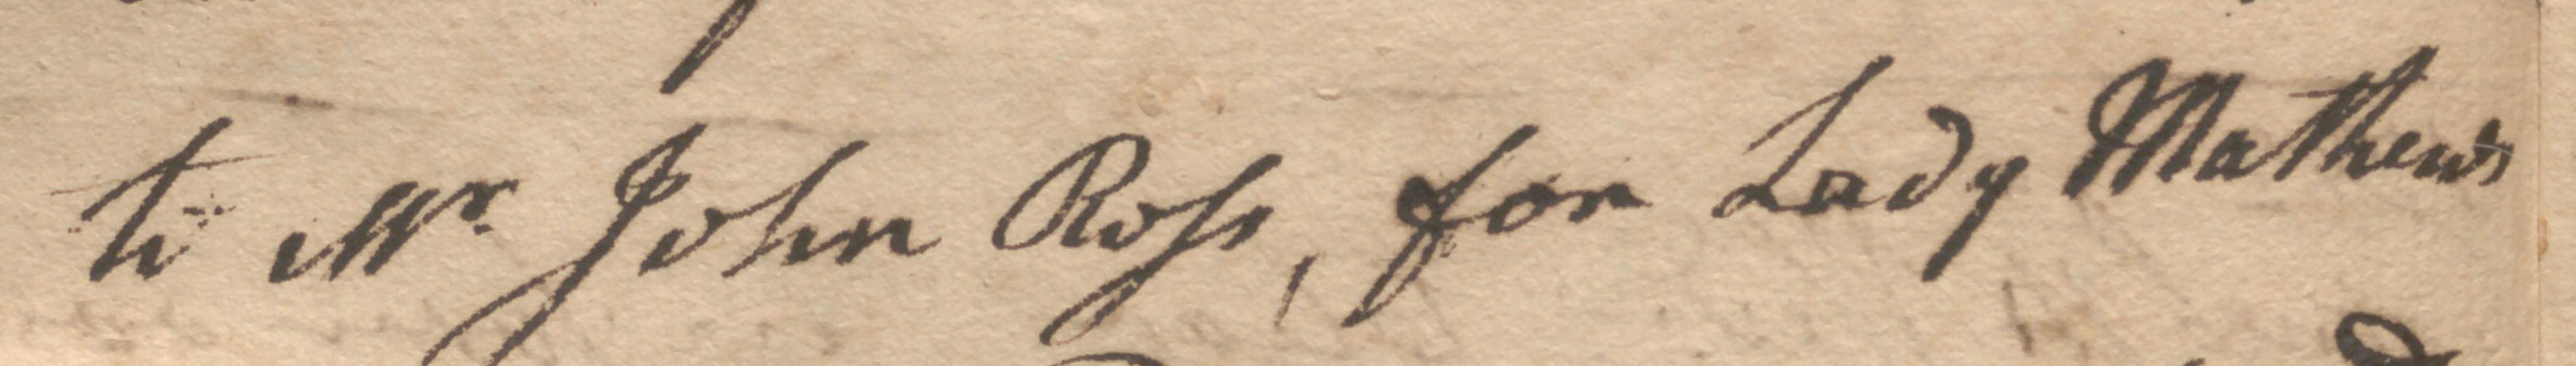to M^r. John Ross for Lady Mathews
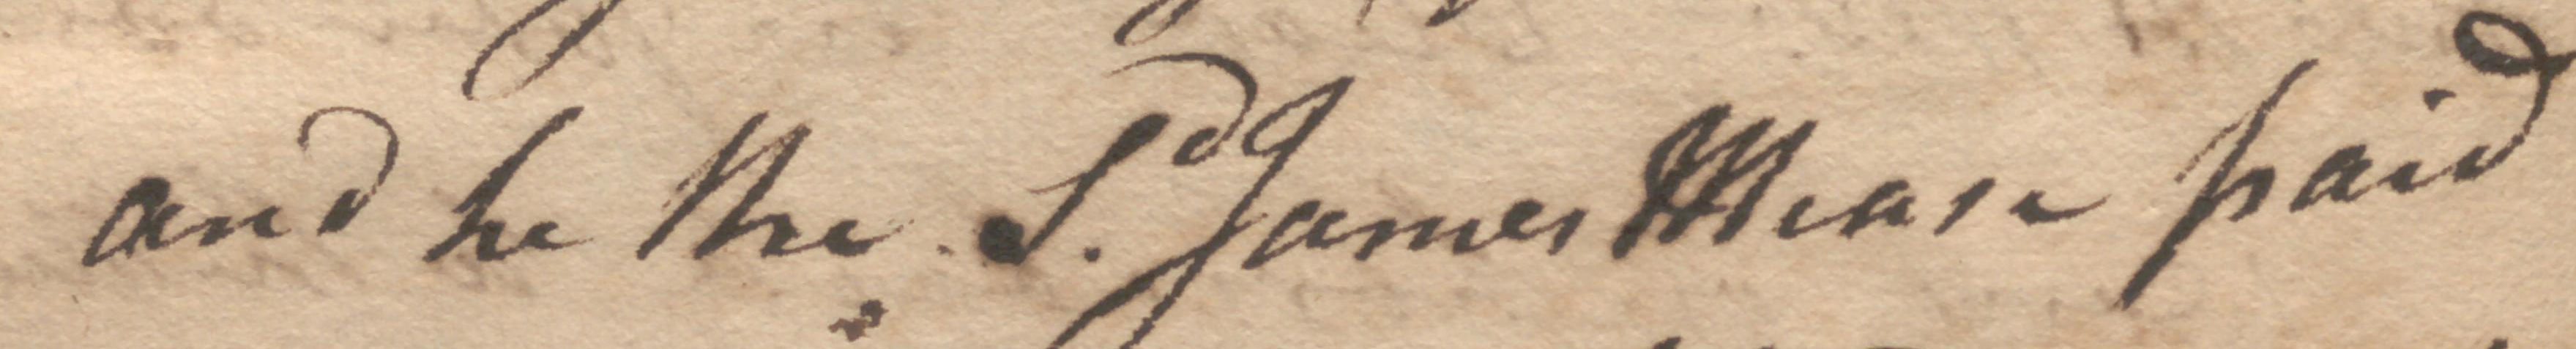and he the s^d. James Mease paid
